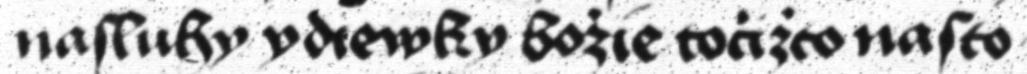naſluhy y diewky bożíe toċiżto naſto
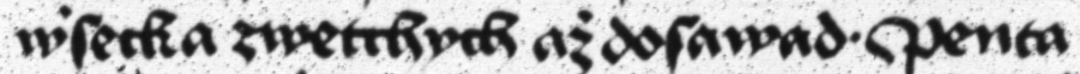wẛecka zwetchych aż doſawad.Penta
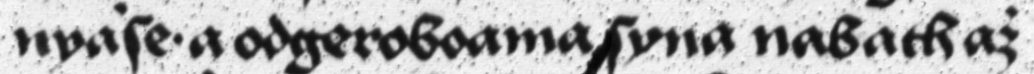nyaẛe a odgeroboama ſyna nabath aż
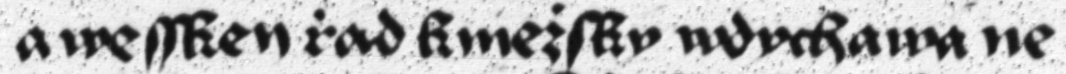a weſſken ṙad knieżsky wdychawa ne
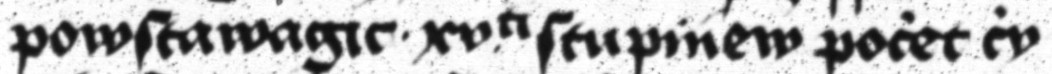powstawagíc, xvti stupṅíew poċet ċy
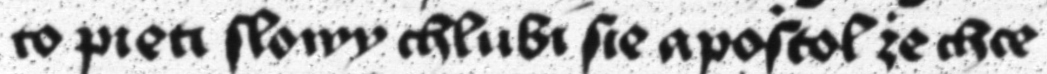to pieti ſlowy chlubí ſie apoẛtol że chce
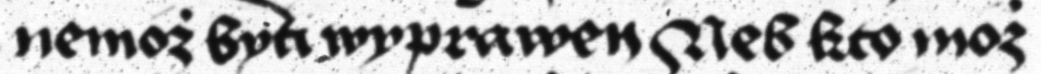nemóž byti wyprawen Neb kto moż
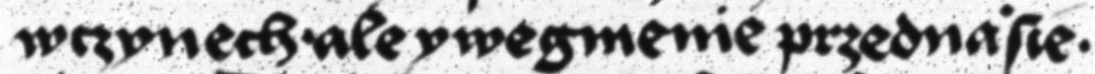wczynech ale y wegmenie przednaẛíe.
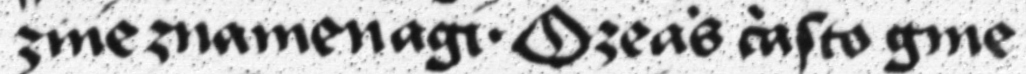zníe znamenagí. Ozeaṡ ċaſto gme
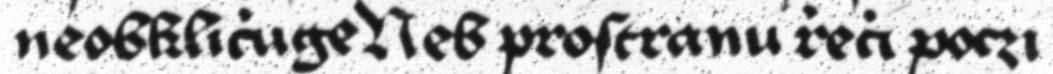neobkliċuge Neb prostranú ṙeċí poczi
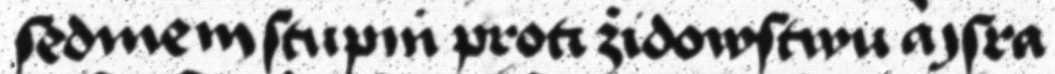ſedmem ſtupni proti żidowſtwu aiſra
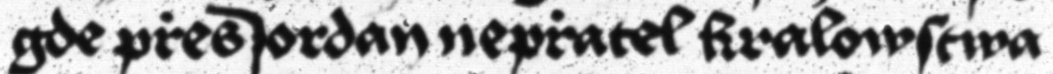gde pṙes Iordán nepṙatel kralowſtwa
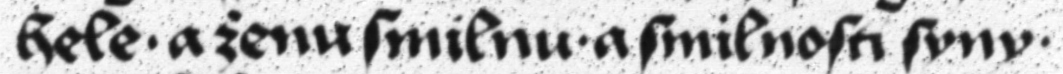hele. a żenu ſmilnu a ſmilnosti ſyny.
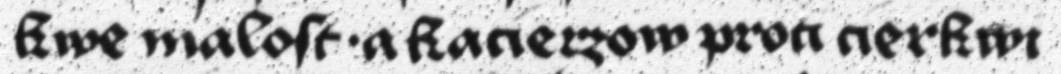kwe maloſt. a kacíerzow proti cíerkwi
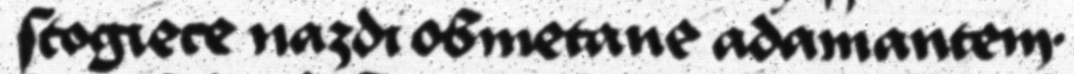ſtogíece nazdi obmetané adamantem.
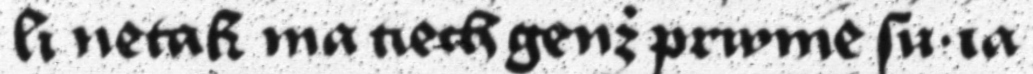li netak ma tiech genż prwníe ſu. ia
